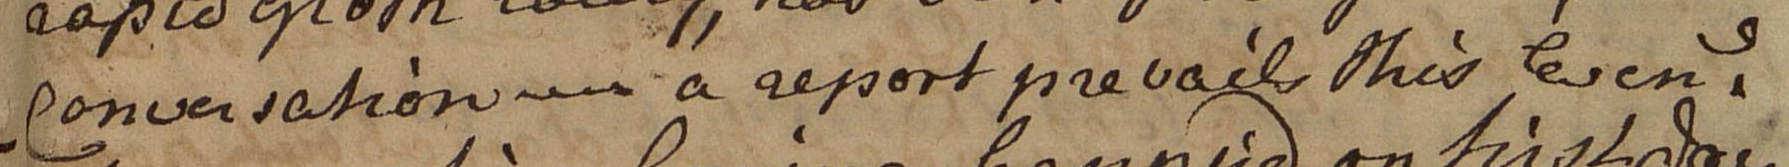Conversation- a report prevails this Even.^g
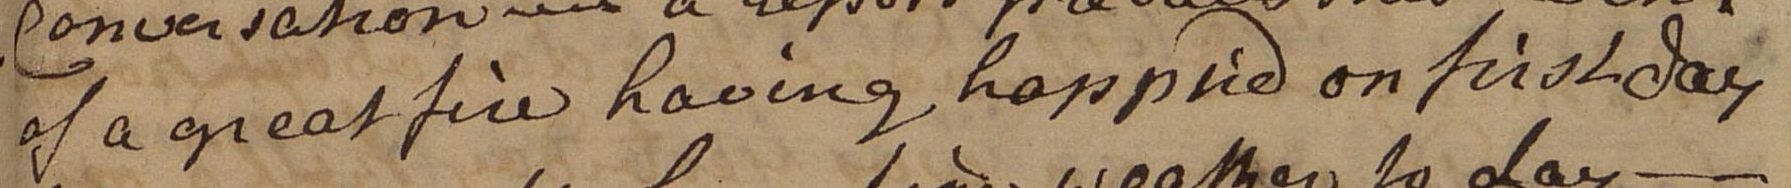of a great fire having hoppn'd on first day
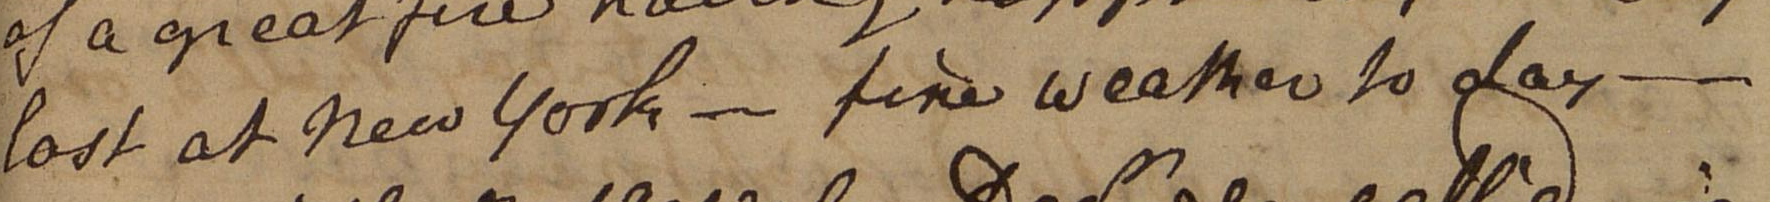lost at new York- fine weather to day-
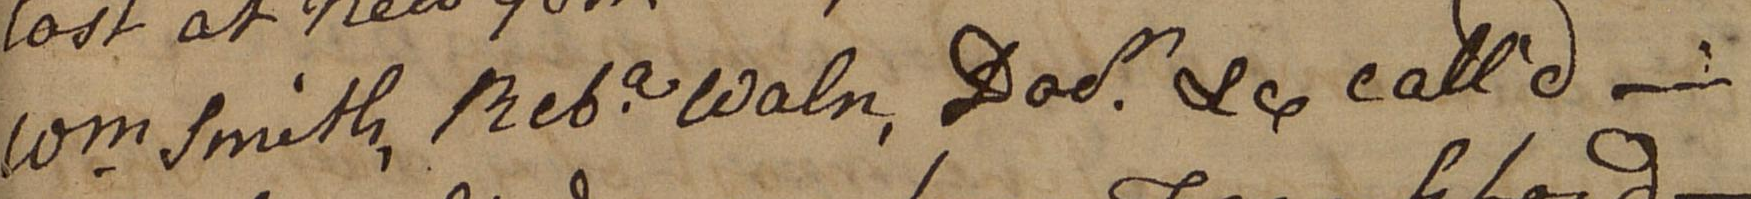W^m Smith, Reb^a. Waln, Doc^r. &c call'd-
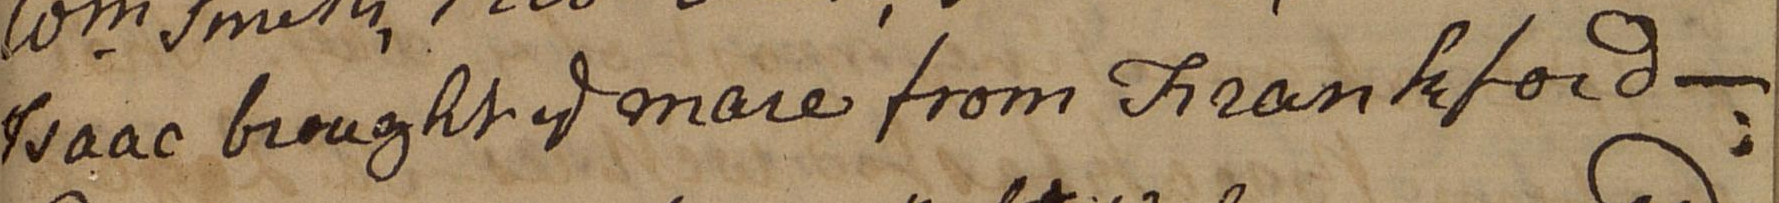Isaac brought y^e mare from Frankford-
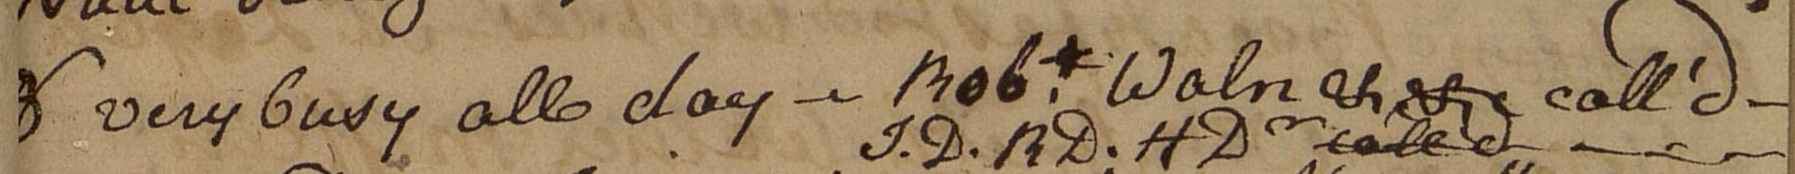8 very busy all day- Rob^t. Waln &c &c call'd
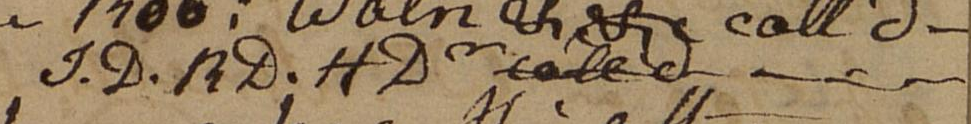J.D. RD. HD^r call'd-
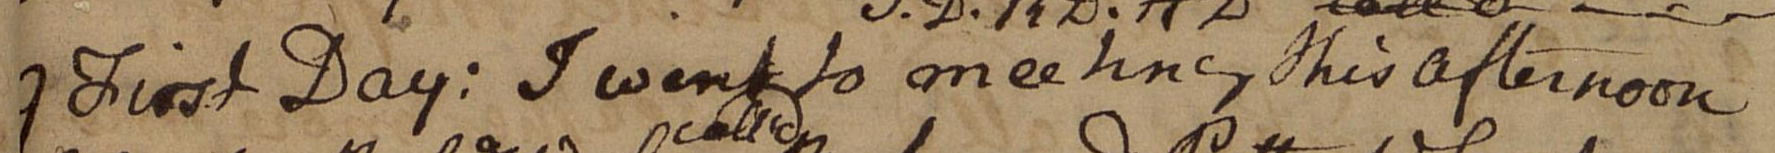9 First Day: I went to meeting, this afternoon
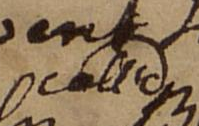call'd
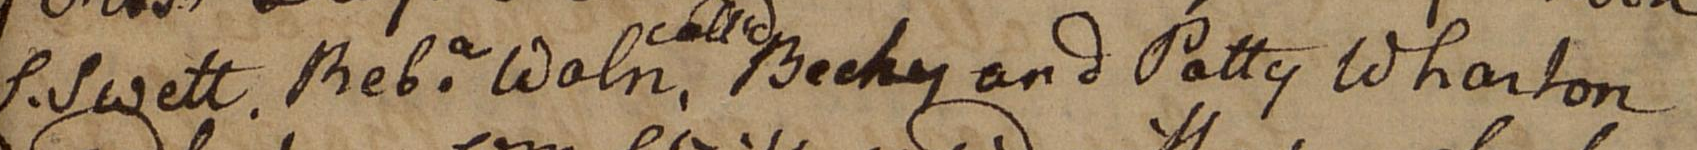S. Swett, Reb.^a Waln, Becky and Patty Wharton
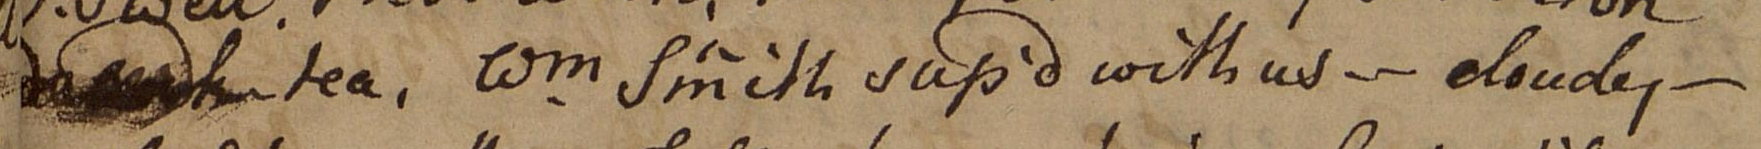drank tea, W^m. Smith sup'd with us- cloudy-
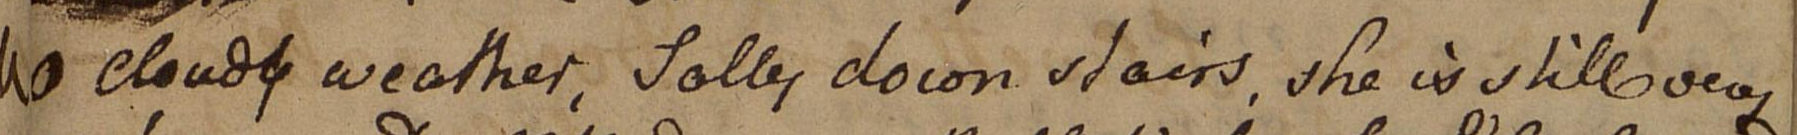0 Cloudy weather, Sally down stairs, she is still very
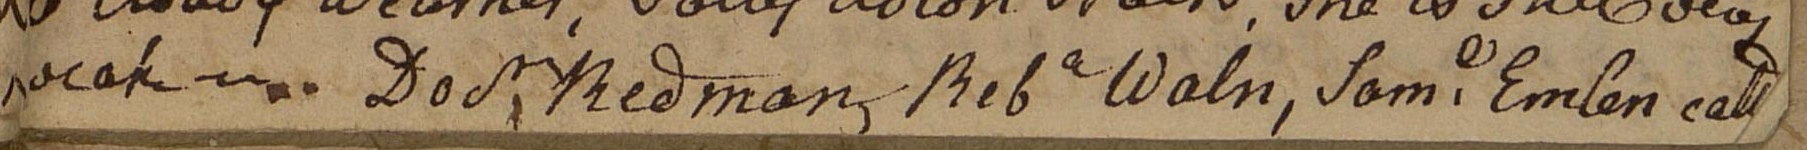sick- Doc^r. Redman, Reb^a Waln, Sam^l. Emlen call
